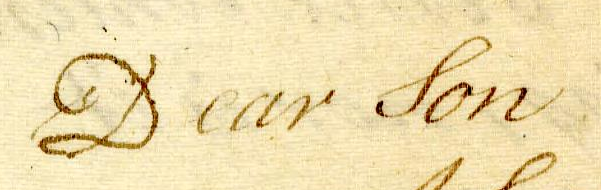Dear Son
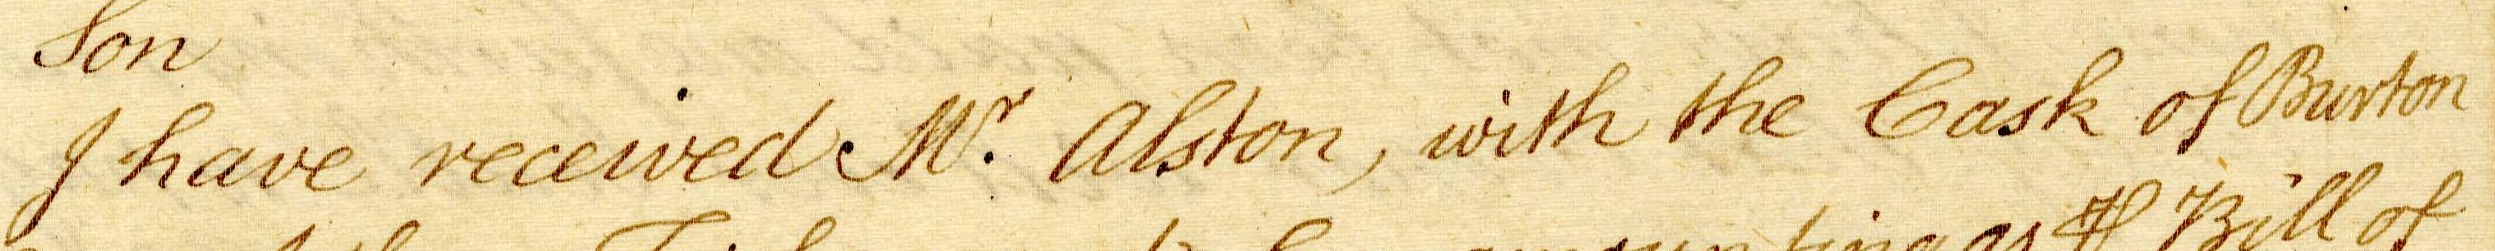I have received M^r. Alston, with the Cask of Burton
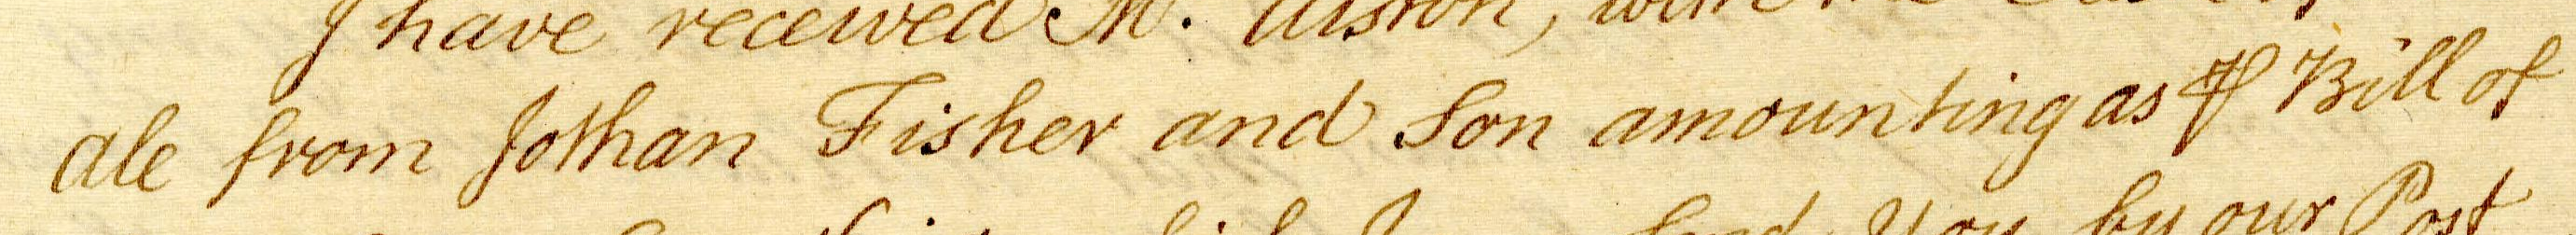Ale from Jothan Fisher and Son amounting as per Bill of
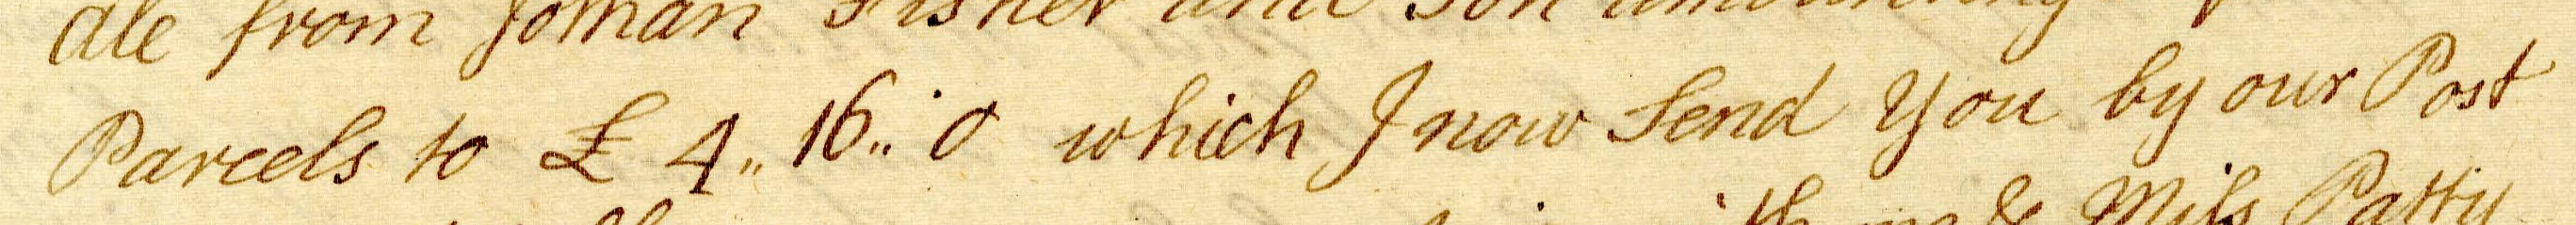Parcels to £4..16..0 which I now Send You by our Post
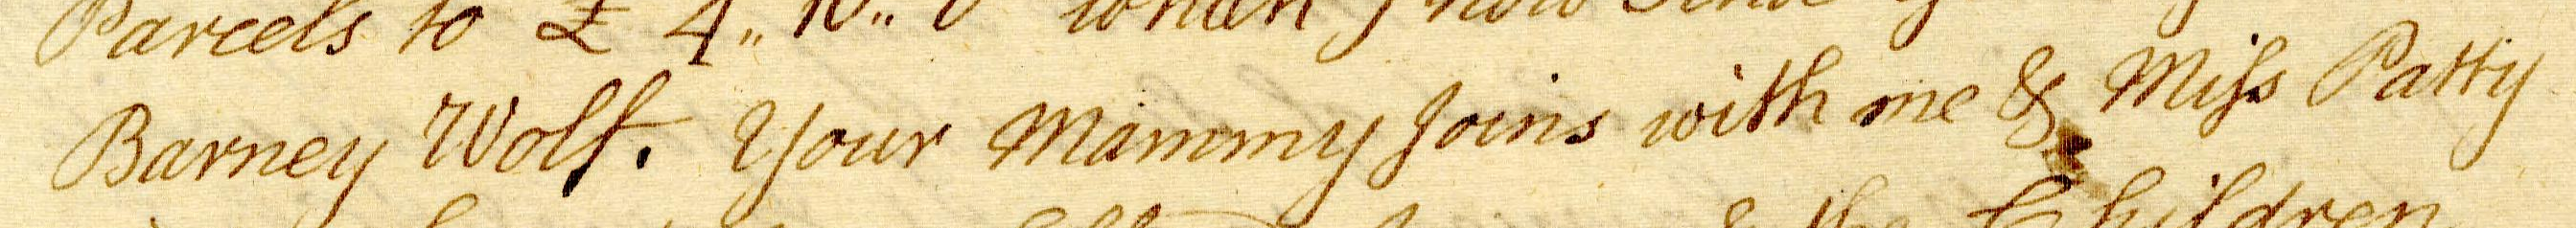Barney Wolf. Your Mammy Joins with me & Miss Patty
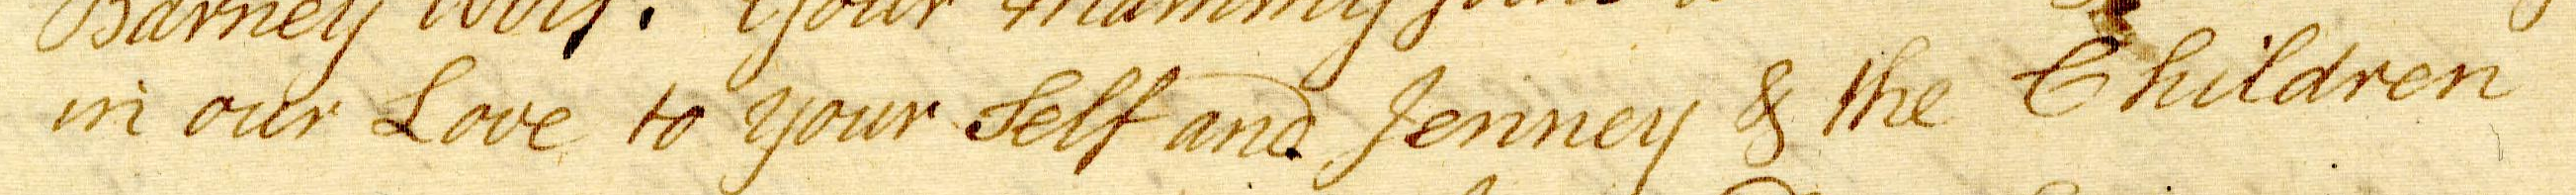in our Love to Your Self and Jenney & the Children
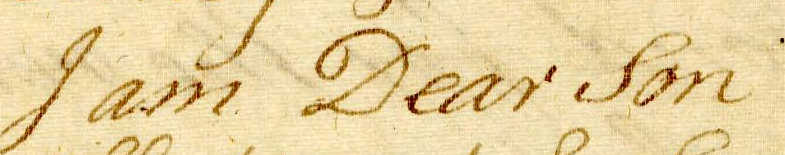I am Dear Son
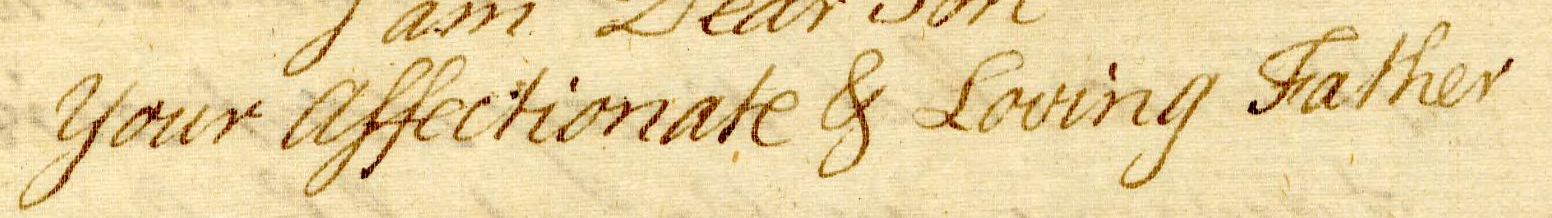Your Affectionate & Loving Father
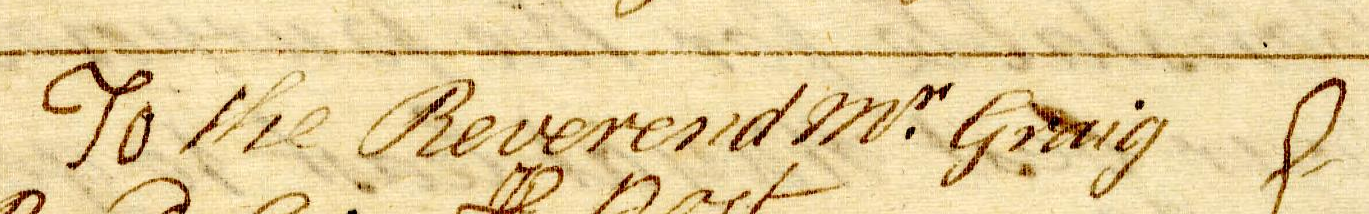To the Reverend M^r. Graig
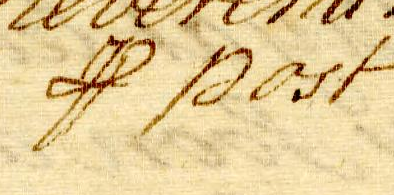per Post
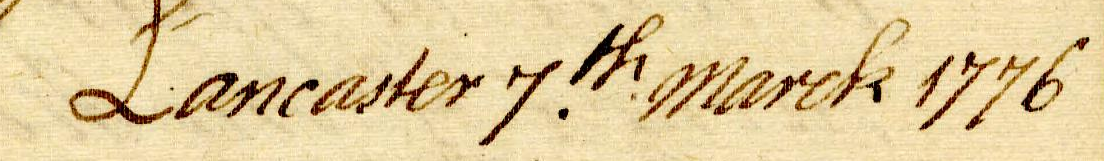Lancaster 7^th. March 1776
